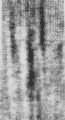亓（其）
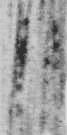○（文）
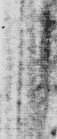也
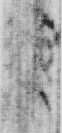○（幣）
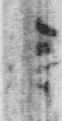帛
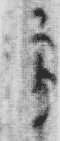所
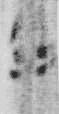㠯（以）
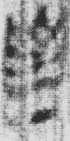爲
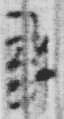○（信）
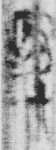與
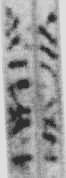登（徵）
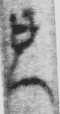也
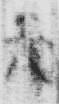亓（其）
